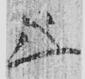之
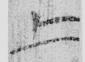上
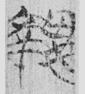執（執）
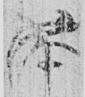民
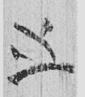之
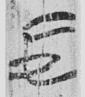𠁩
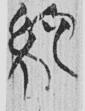○（施）
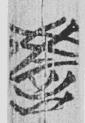○（教）
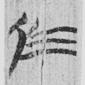於
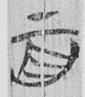百
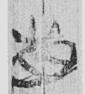眚（姓）
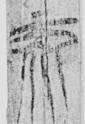而
